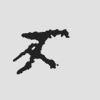天
